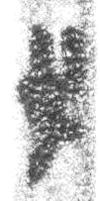戔
